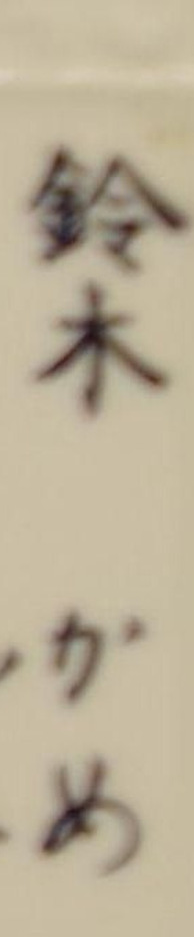鈴木かめ
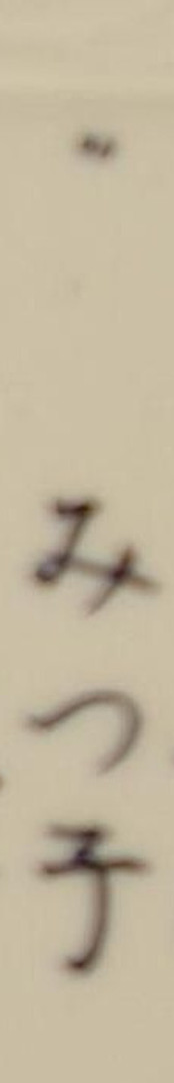みつ子
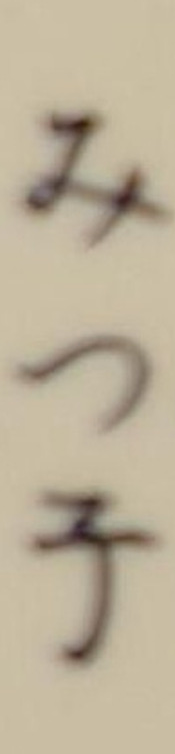みつ子
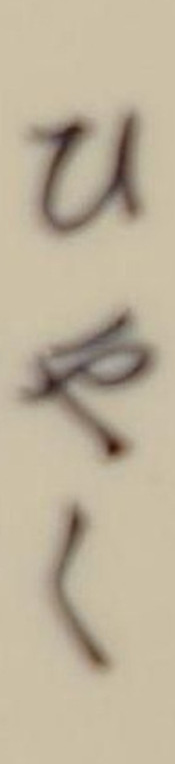ひやく
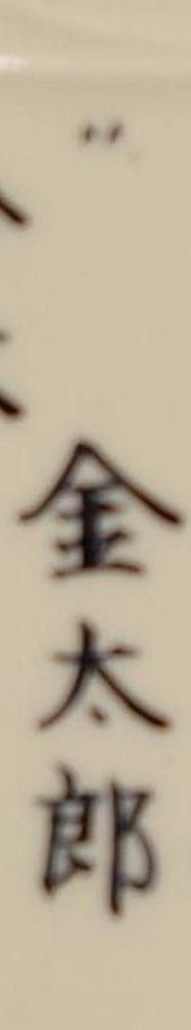金太郎
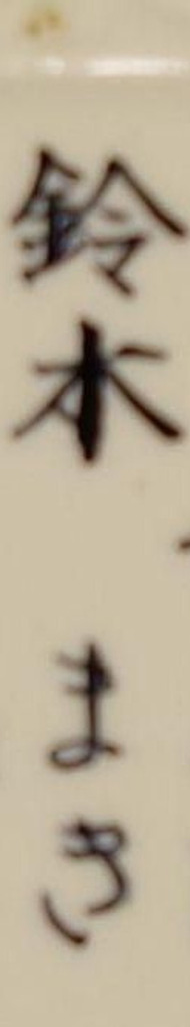鈴木まき
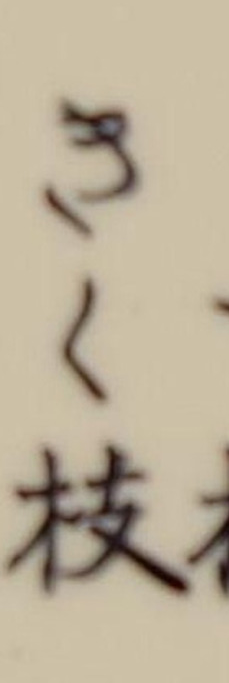きく枝
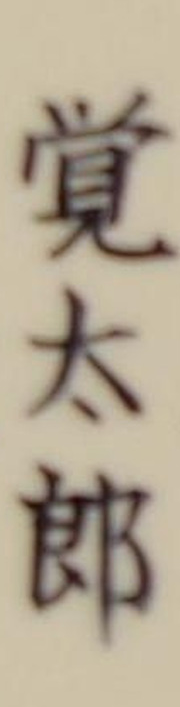覚太郎
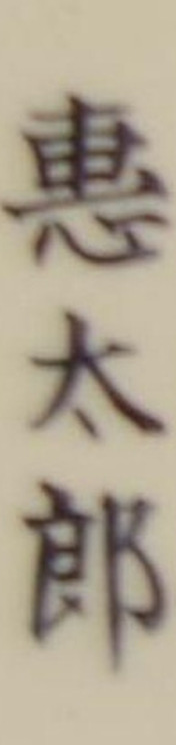恵太郎

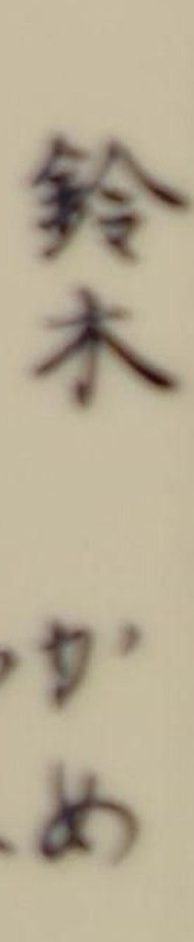鈴木かめ
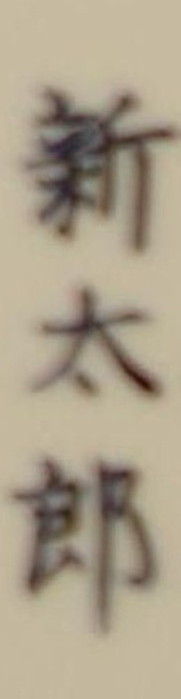新太郎
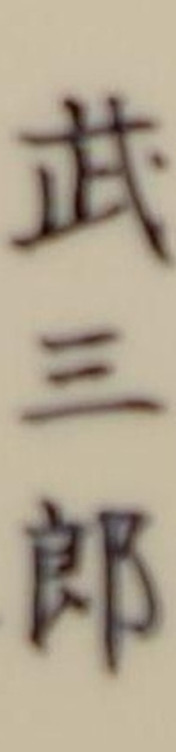武三郎
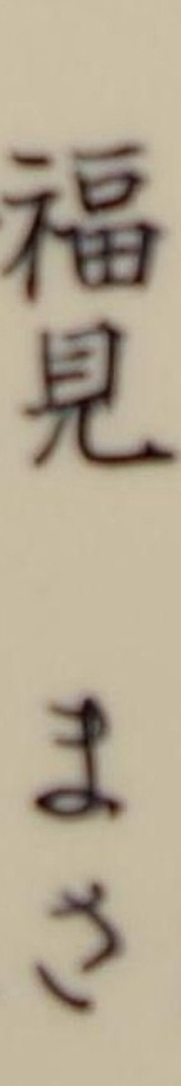福見まさ
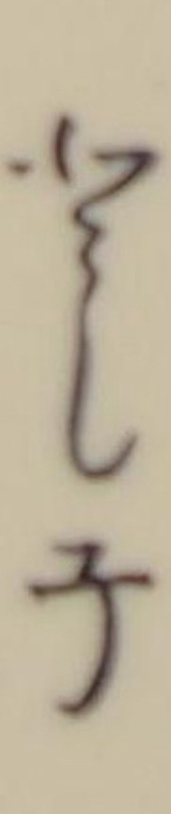とし子
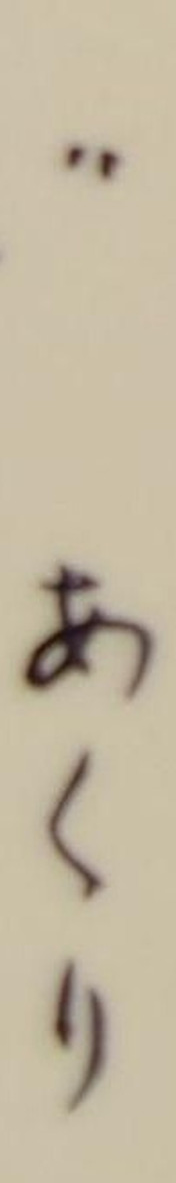あくり
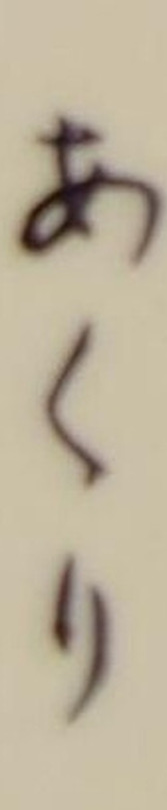あくり
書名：A~D
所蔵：koyasan kongobuji
